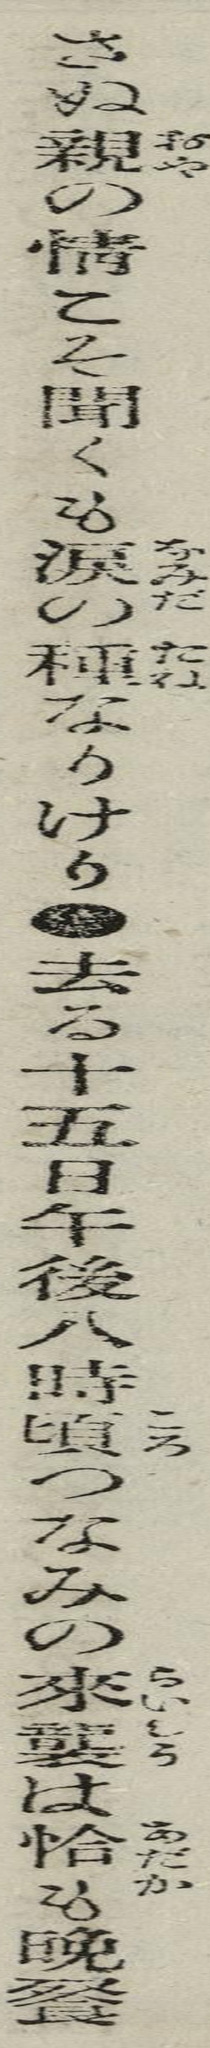さぬ親の情こそ聞くも涙の種なりける●去る十五日午後八時頃つなみの来襲は恰も晩餐
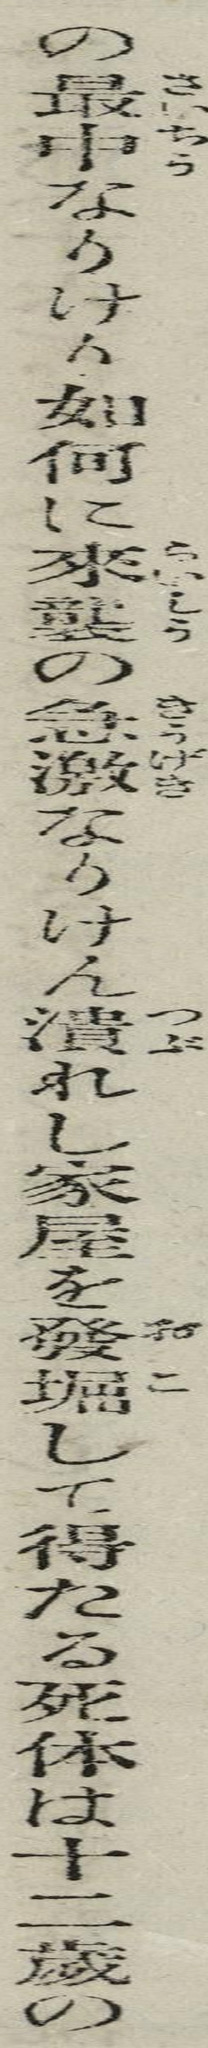の最中なりけり如何にも来襲の急激なりけん潰れし家屋を発掘して得たる死体は十二歳の
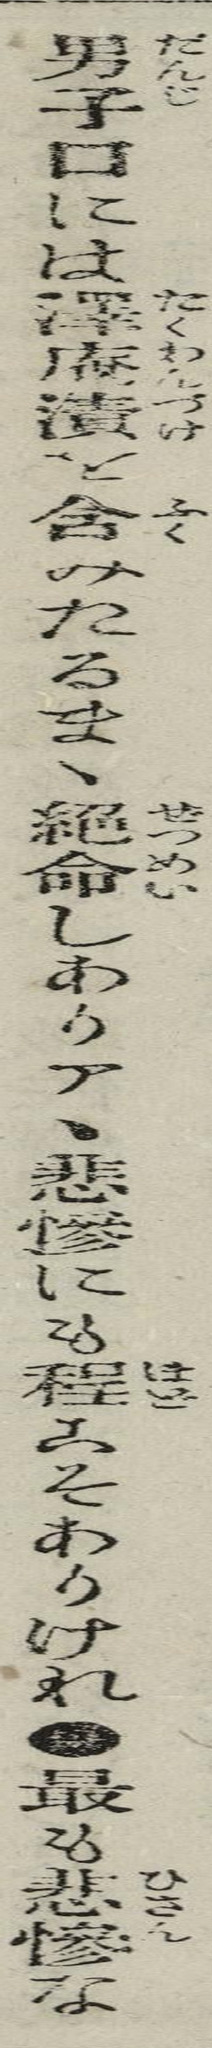男子口には澤庵漬を含みたるまヽ絶命しありアヽ悲惨にも程こそありけれ●最も悲惨な
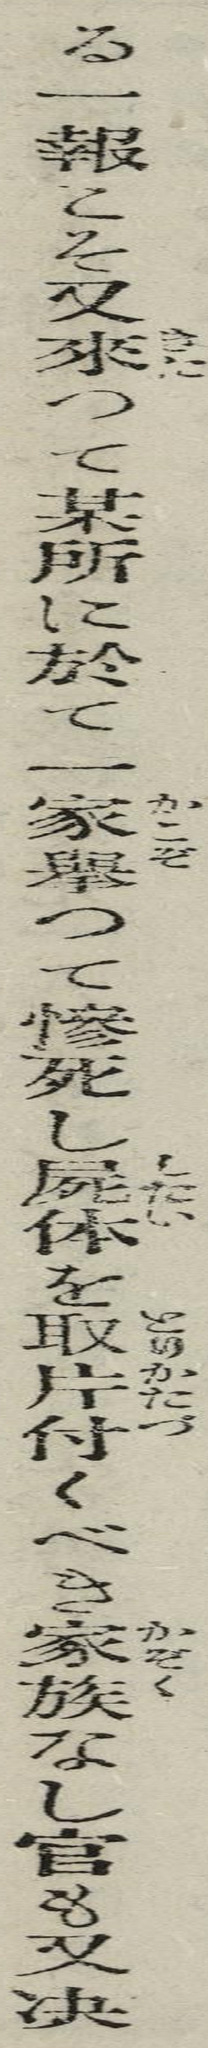る一報こそ又来つて某所に於て一家挙つて惨死し屍体を取片付くべき家族なし官も又决
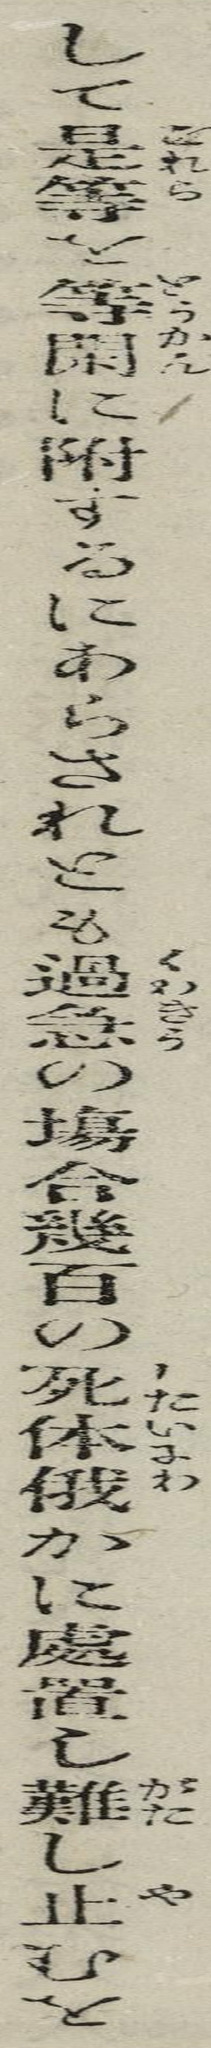して是等を等閑に附するにあらされとも過急の場合幾百の死体俄かに処置し難し止むを
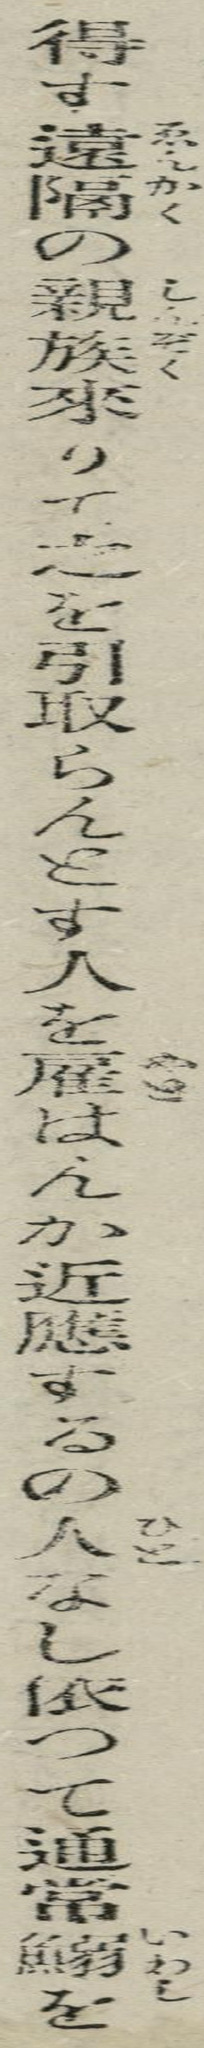得す遠隔の親族来りて之を引取らんとす人を雇はんか近応する人なし依つて通常鰯を
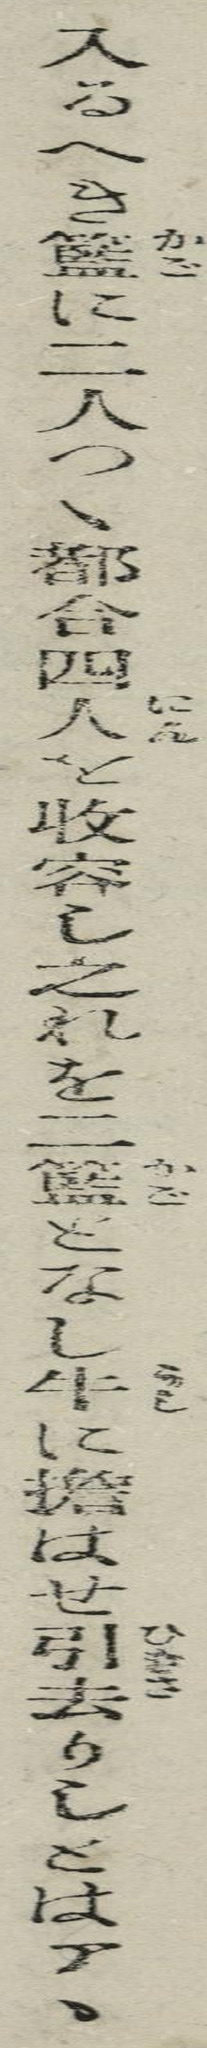入るへき籃に二人つ都合四人を収容し之れを二籃となし牛に担はせ引去りしとはあゝ
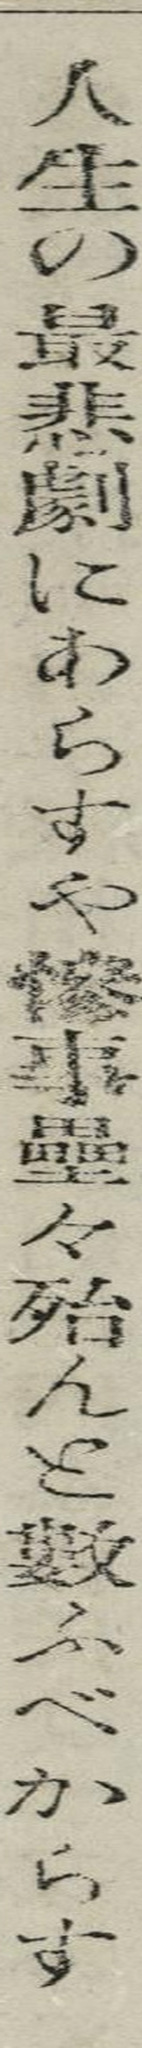人生の最悲劇にあらすや惨事累々殆と数ふべからす
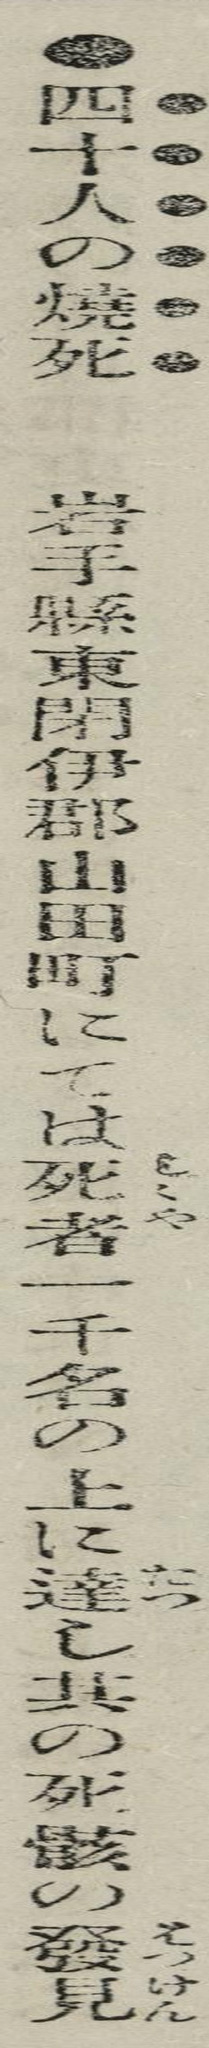●四十人の焼死岩手県東閉伊郡山田町にては死者一千名の上に達し其の死骸の発見
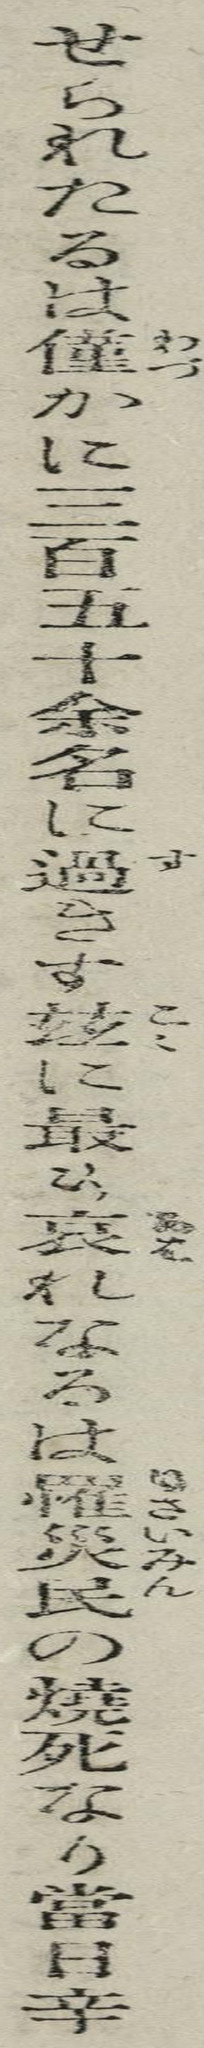せられたるは僅かに三百五十余名に過きす茲に最も哀れなるは罹災民の焼死なり当日辛
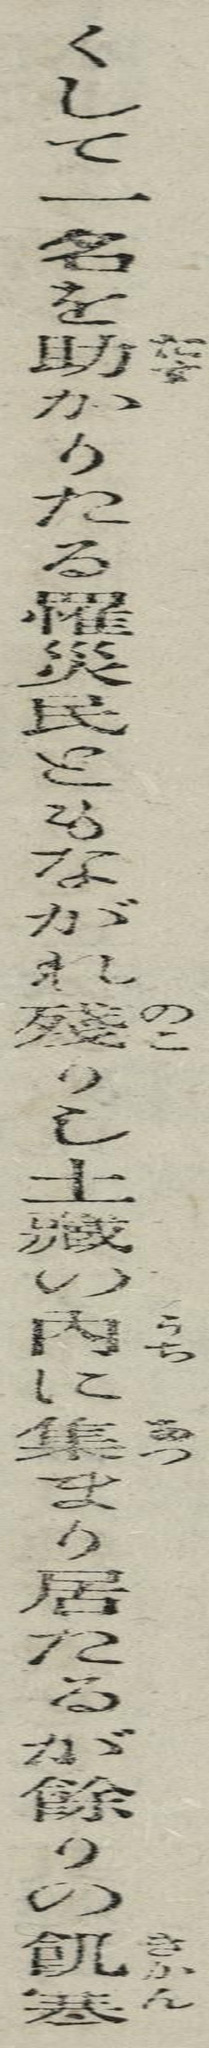くして一名を助かりたる罹災民ともながれ残りし土蔵の内に集まり居たるが餘の飢寒
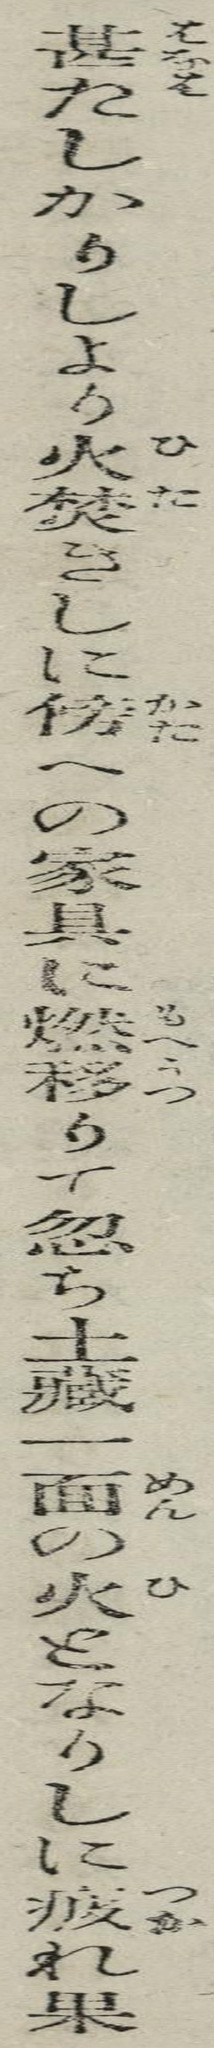甚たしかりしより火焚きしに傍への家具に燃移りて忽ち土蔵一面の火となりしに疲れ果
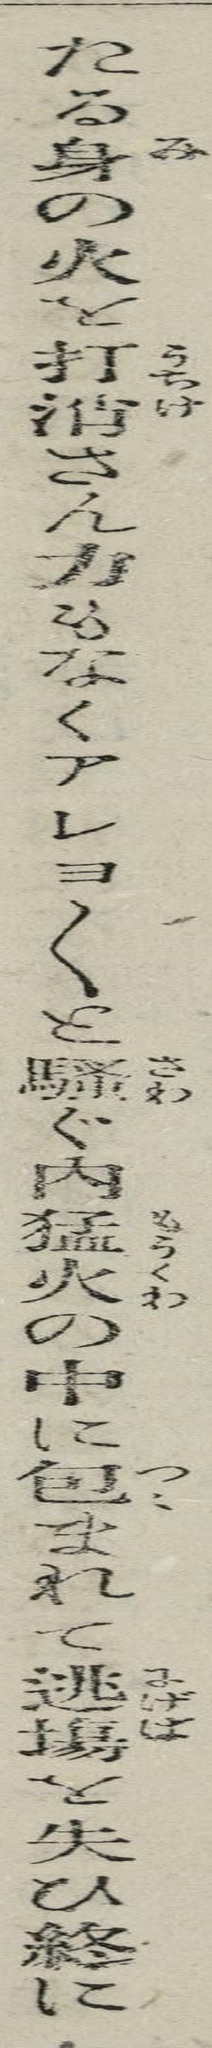たる身の火を打消さん力もなくアレヨ〳〵と騒ぐ内猛火の中に包まれて逃場を失ひ終に
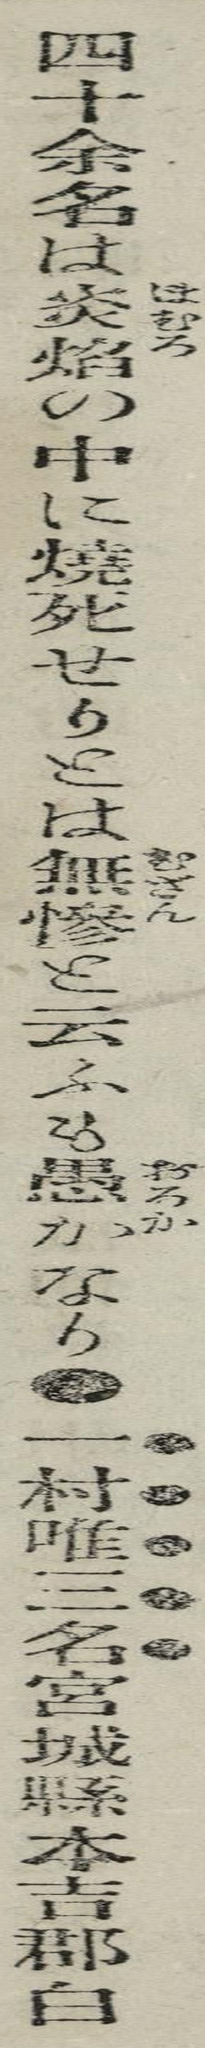四十余名は炎焔の中に焼死せりとは無惨と云ふも愚かなり●一村唯三名宮城県本吉郡白
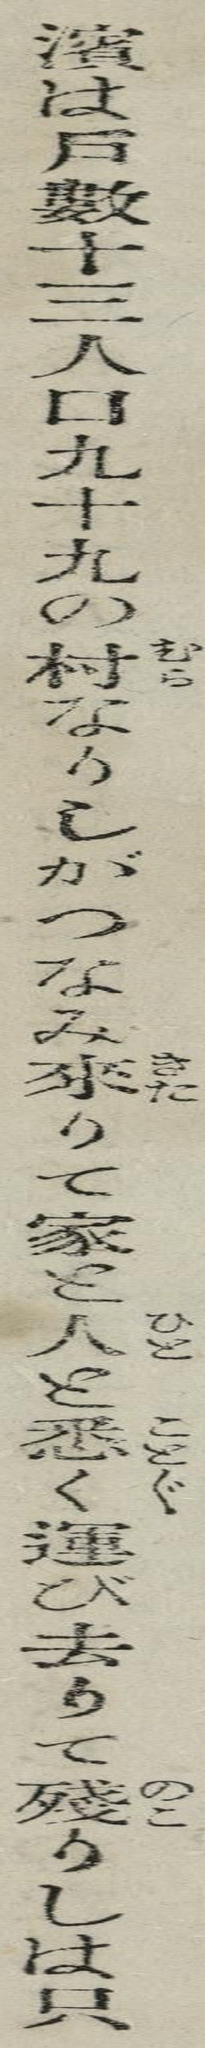濱は戸数十三人口九十九の村なりしがつなみ来りて家と人と悉く運び去りて残りしは只
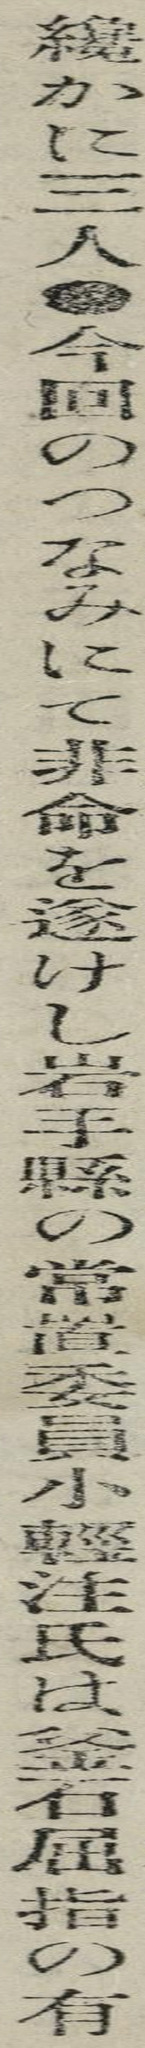纔かに三人●今回のつなみにて非命を遂けし岩手県の常置委員小軽注氏は釜石屈指の有
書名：三陸海嘯細見
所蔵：東京大学地震研究所図書室 Earthquake Research Institute Library, The University of Tokyo, JAPAN
